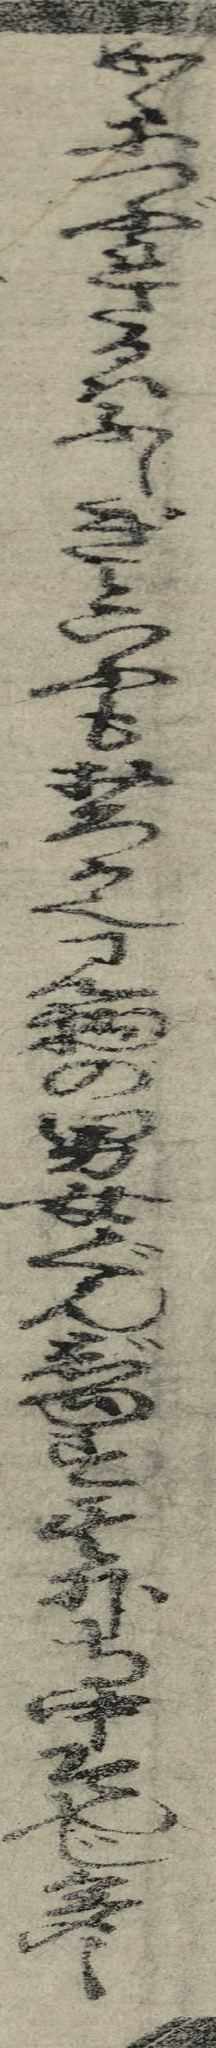如くにつぶれたるはふしぎといふもおろか也見物の男女ぐんじゆす其外寺中そんじ多し
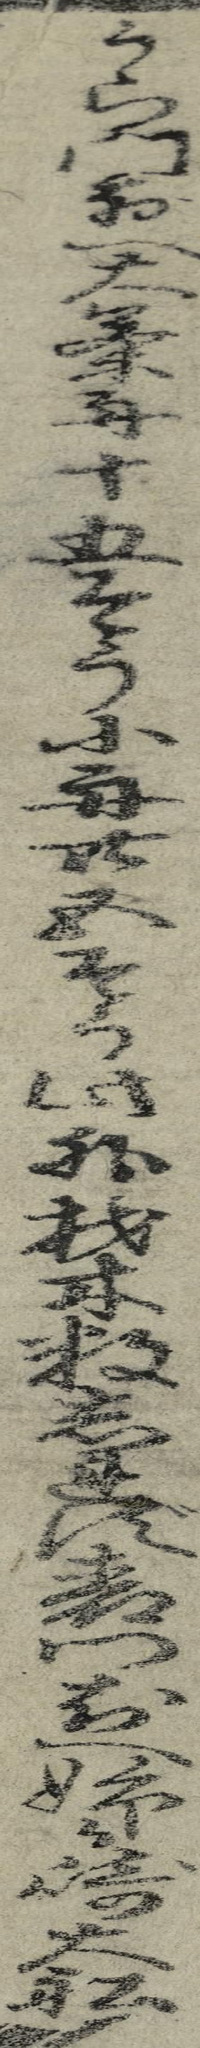うら門前へ大茶舟十五そう小舟廿五そう此外材木数しれず表門前へ姉ヶ崎大船
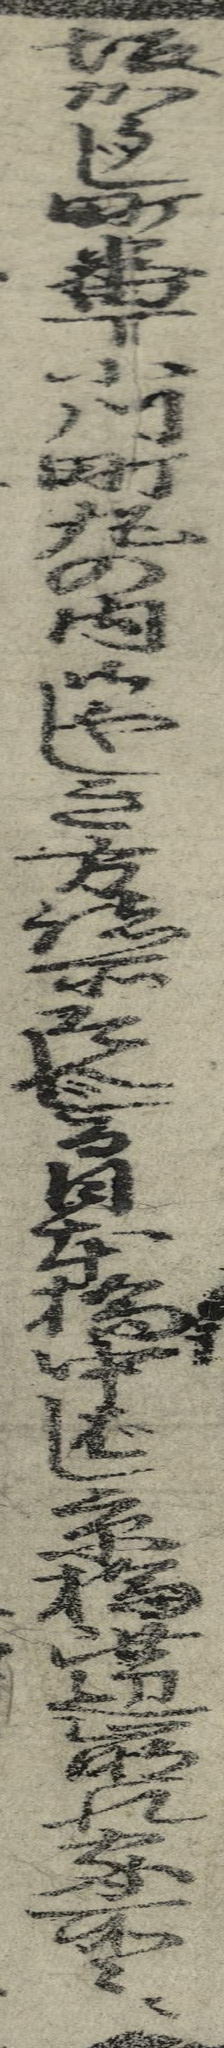坂かうじ町番丁小川丁丸の内御やしき方諸所そんじる日本橋中ばし京橋此辺崩れ家所々に
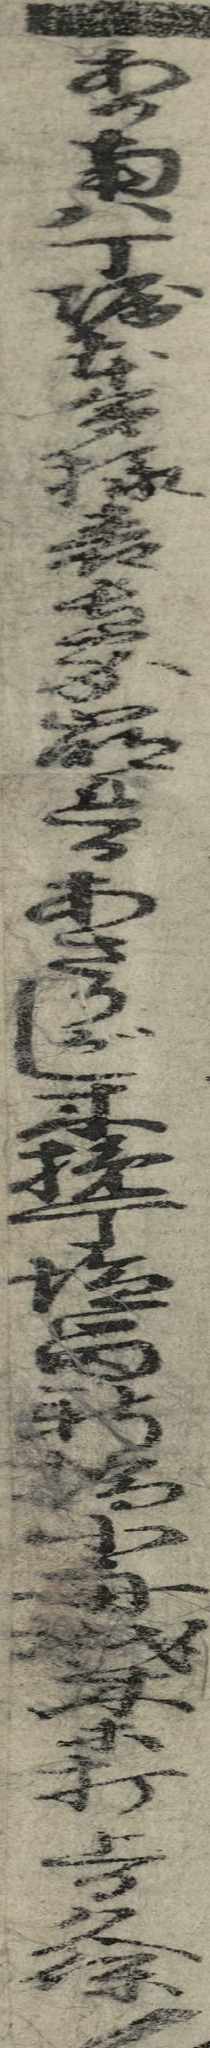あり南八丁堀本多様表長家崩れるあさりがし木挽丁塩留新橋小舟材木等打上る久保
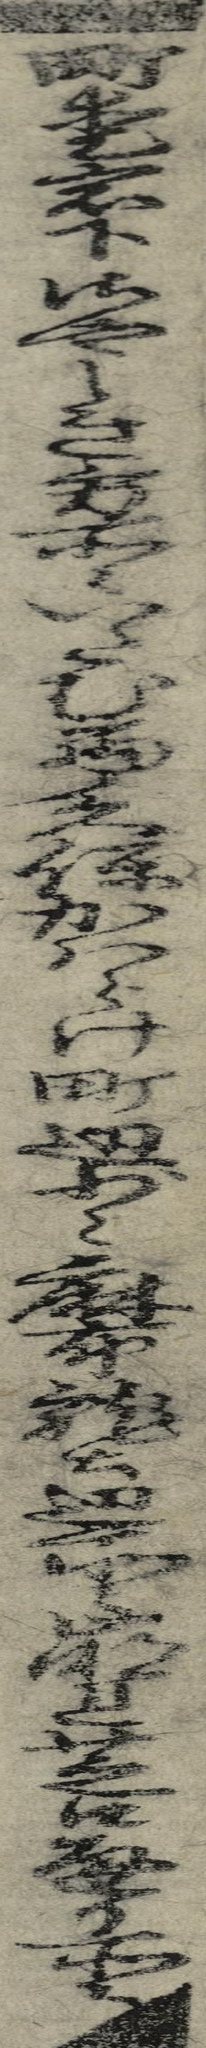町愛宕下御やしき方所々いたむ西ノ久保かはらけ町辺少々麻布龍土辺所々崩れ芝口通り所々
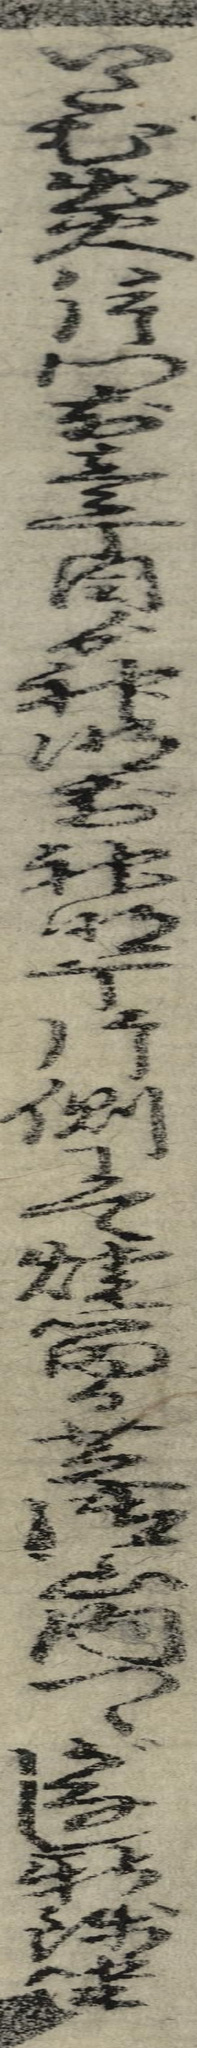いたむ出火は片門前壱三丁目ゟ神明前神明丁片側にて焼留る芝御山内つゝがなし新銭座
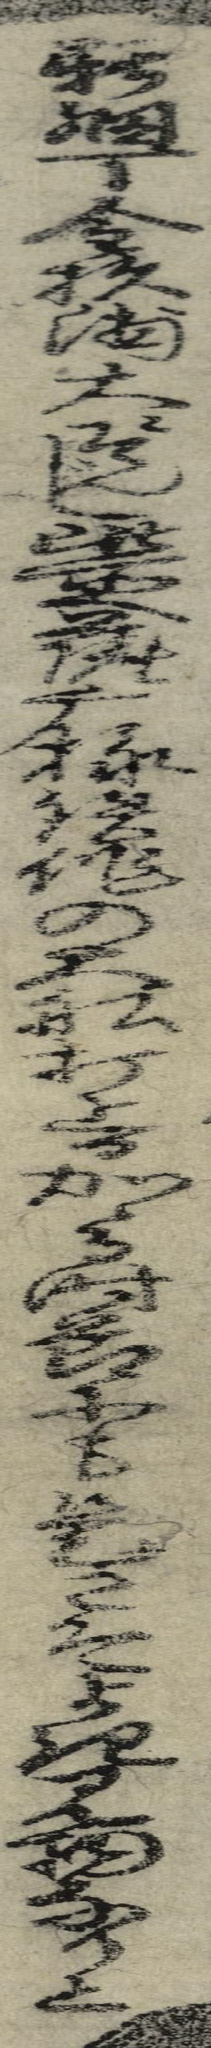新佃丁金杉浦大にそんじ此所へ薩摩様鉄作の大船打上るかゝる時節にも是こそよき見物なりと
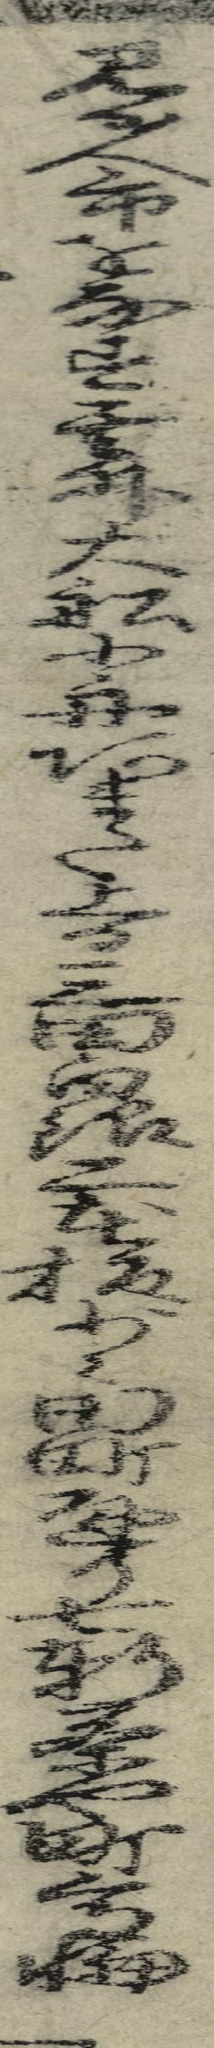見る人市をなす其外大船小舟あまた上る三田白銀二本榎少々田町通り七軒茶や町高輪
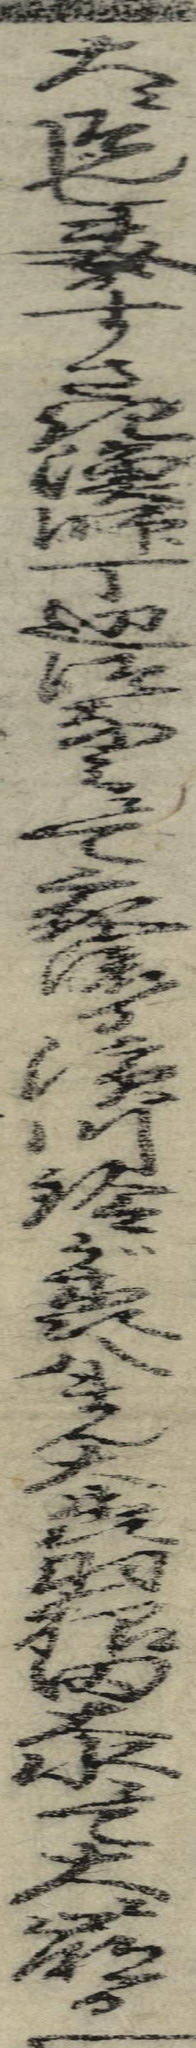大にそんじ夫ゟすさき漁師丁辺つなみにて家流る浜川鈴ヶ森八まん大森羽根田大水にて大に崩る
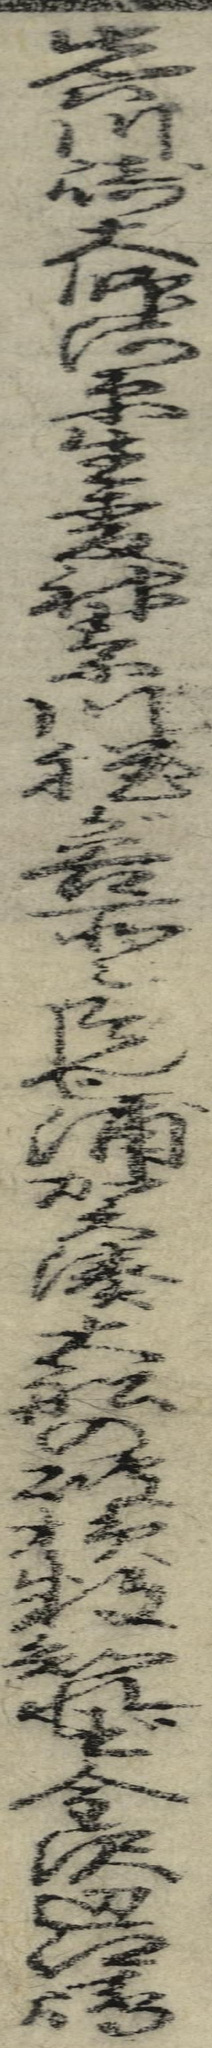先は川崎大師河原生麦神奈川程ヶ谷所々そんじ浦賀湊大船の破損数しらず金沢辺江崎
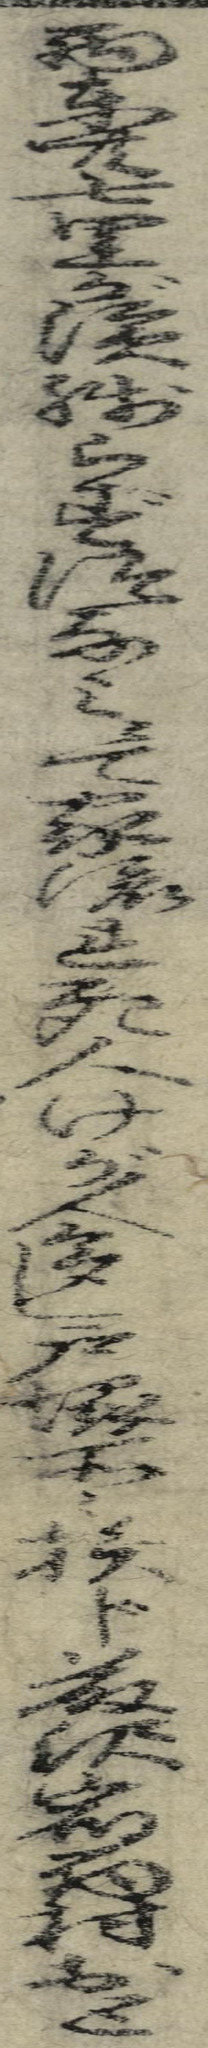西東共七里ヶ浜残らずつなみにて家流れ死人けが人多し戸塚所々損じ藤沢宿西村おと
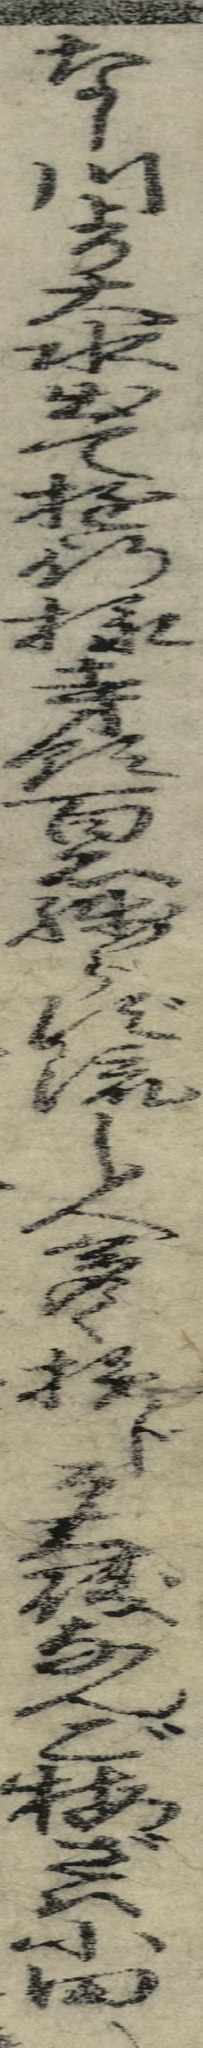なし川より大水出て遊行様寺領百石残らず流し人多く損じる大磯なんご桜ざは小田
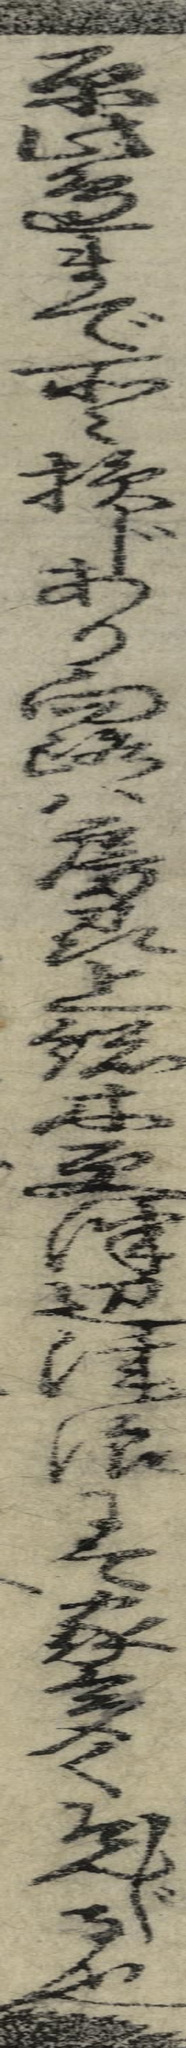原此辺まで所々損じあり向路は房州上総木更津辺津浪にて家多くそんじる也
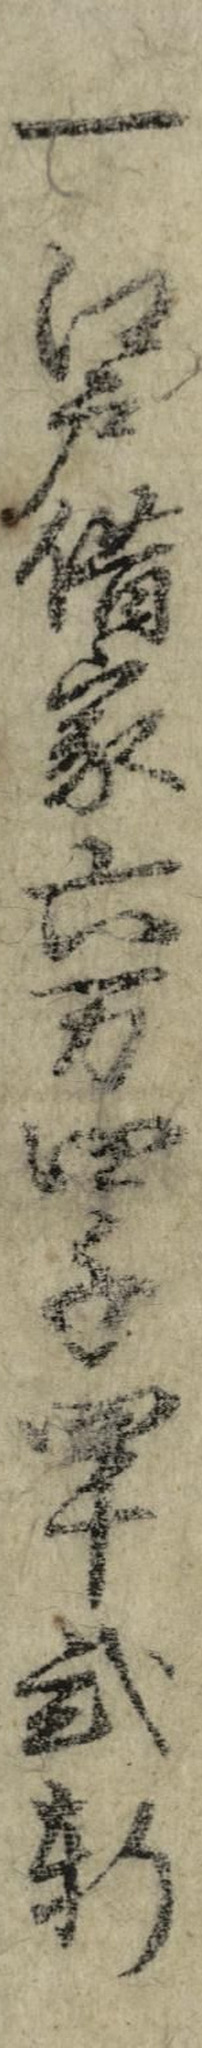一江戸借家六万四千四十弐軒
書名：安政三辰八月廿五日　大風雨出水損場所之圖
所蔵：東京大学地震研究所図書室 Earthquake Research Institute Library, The University of Tokyo, JAPAN
